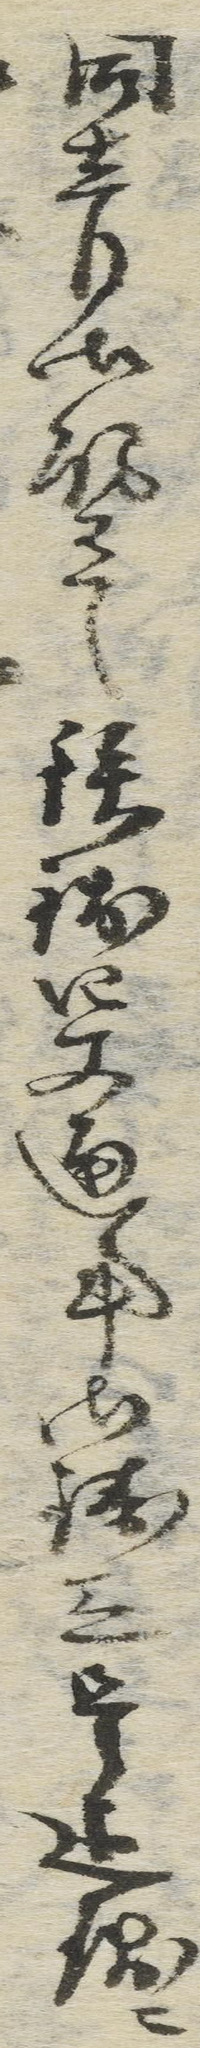同十二月御触有之鉄銭四文通用御銭立是迄銭二
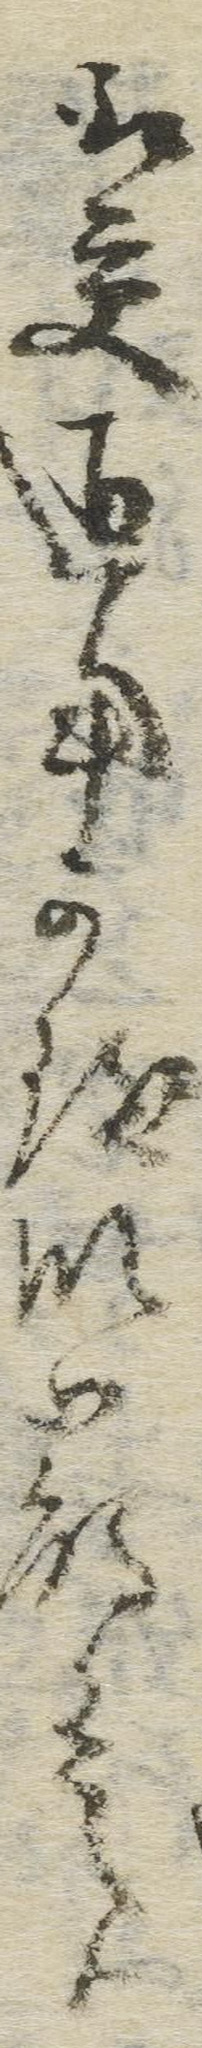取交通用可致様御触有之候
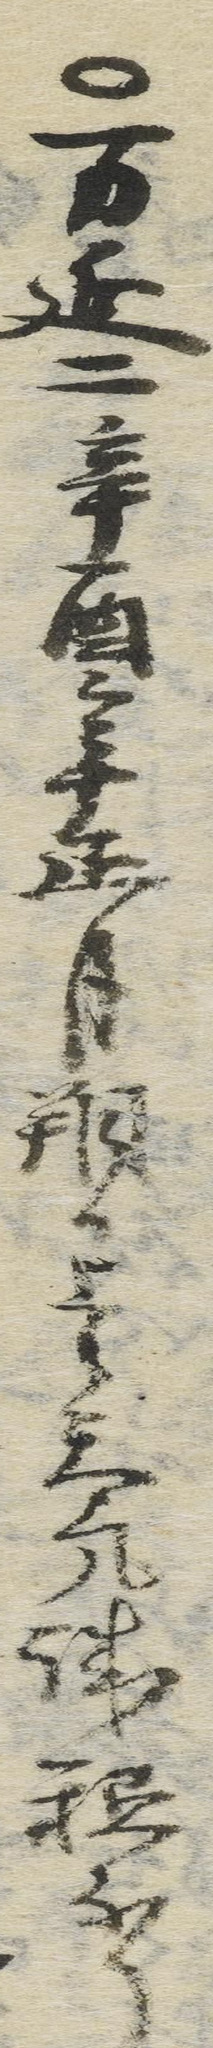○万延二辛酉年正月朔日上々天気誠穏なり
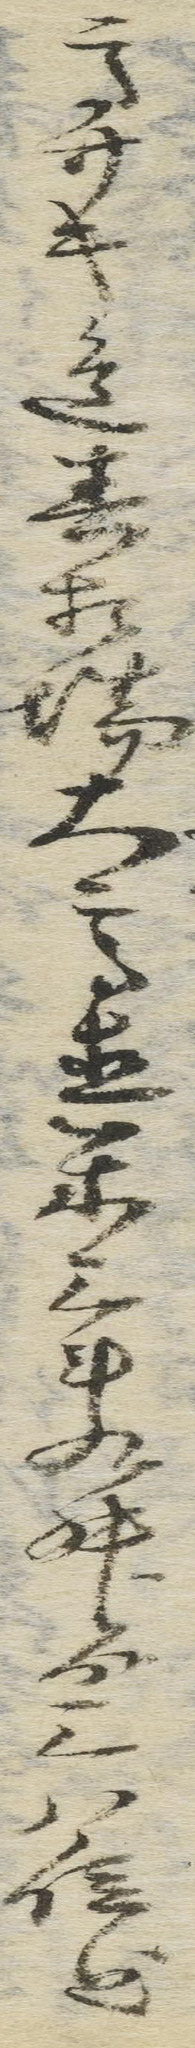高サキ辺夏相場大高直米三斗九升申候より三八位迄
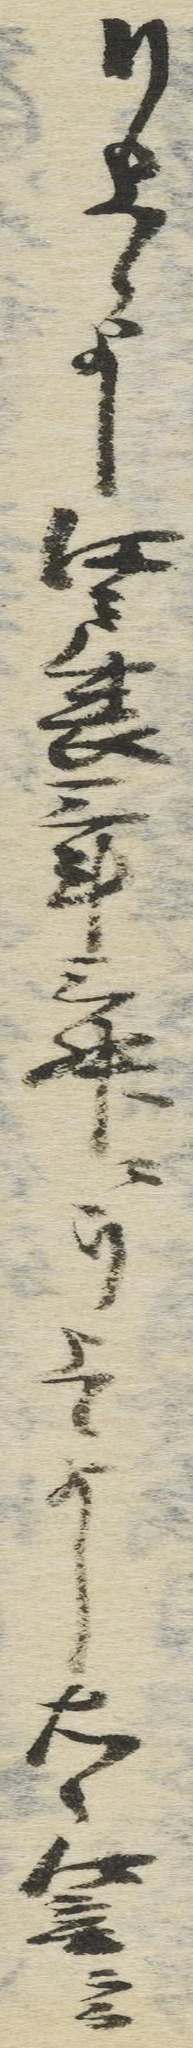引上候よし江戸表三斗三升二引上候よし右之響二而
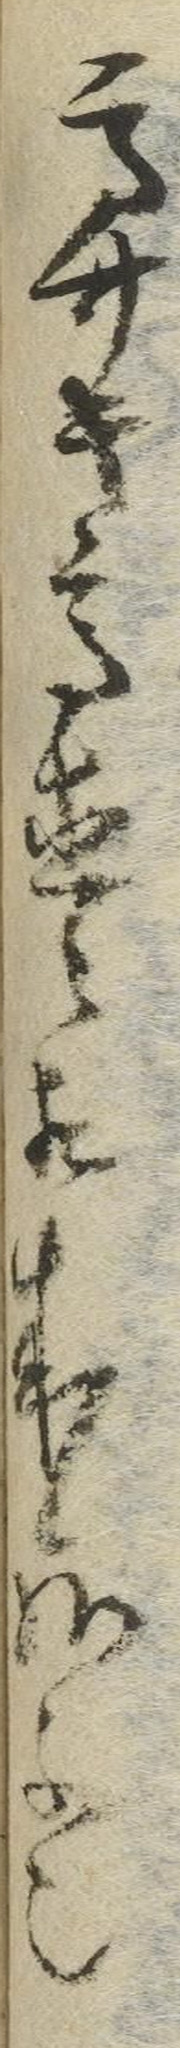高サキ高直ニ相成候様子也
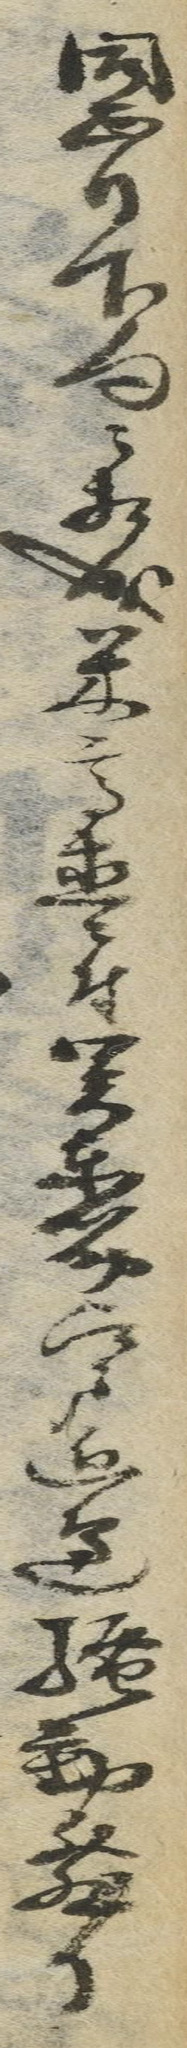同正月下旬二相成米高直に二付関東筋江戸通辺騒動発り
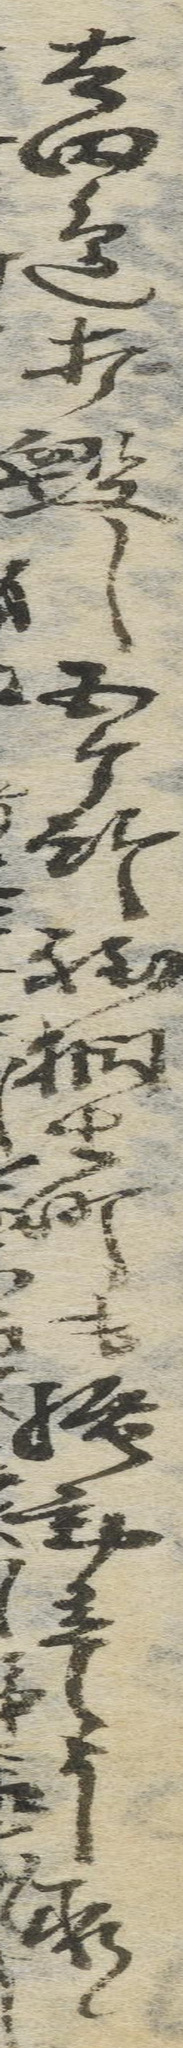太田辺打毀し五ヶ所程桐生町も騒動有之よし承候
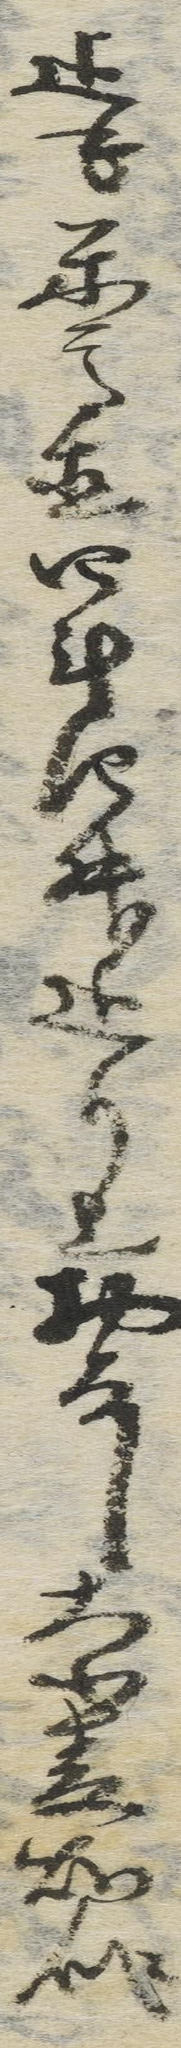迄も米高直四斗四升迄引上おなし大小麦畑作
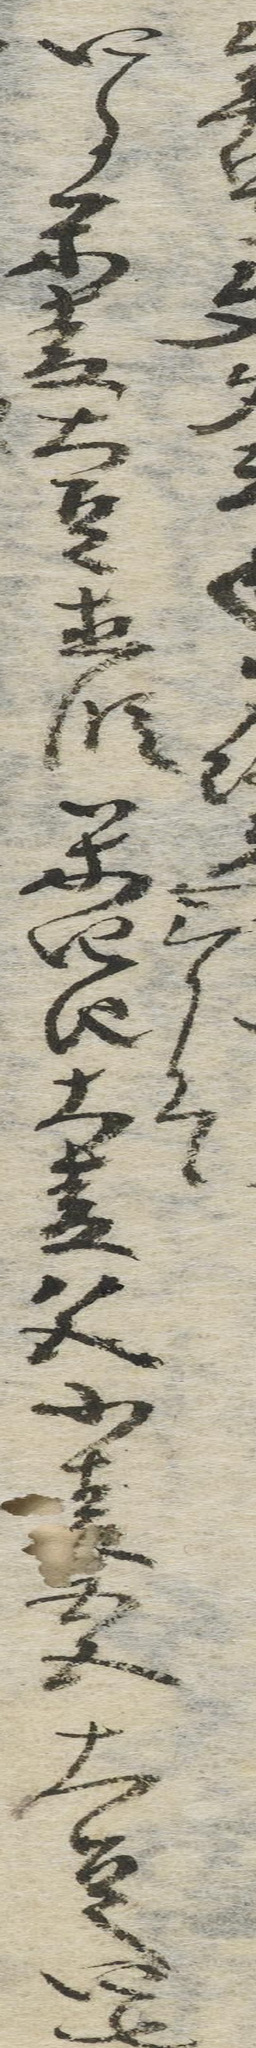四月米麦大豆直段米四四大麦八五小麦五五大豆四七
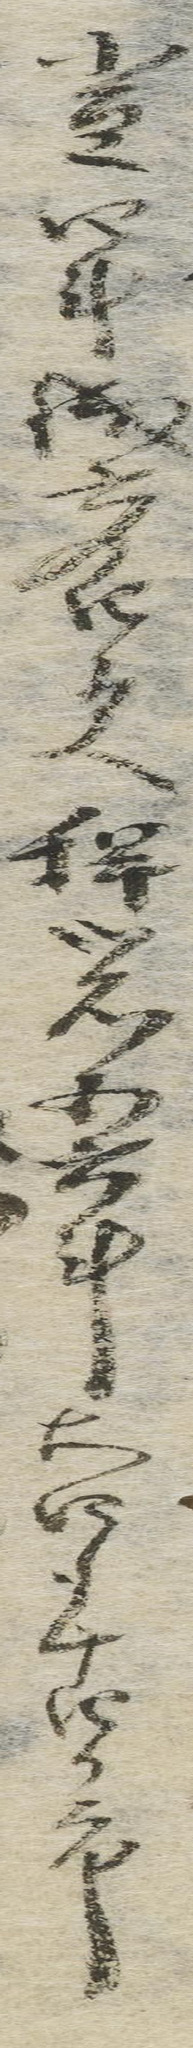小豆四斗銭六貫四百文稗弐石五六斗右四月十四日市
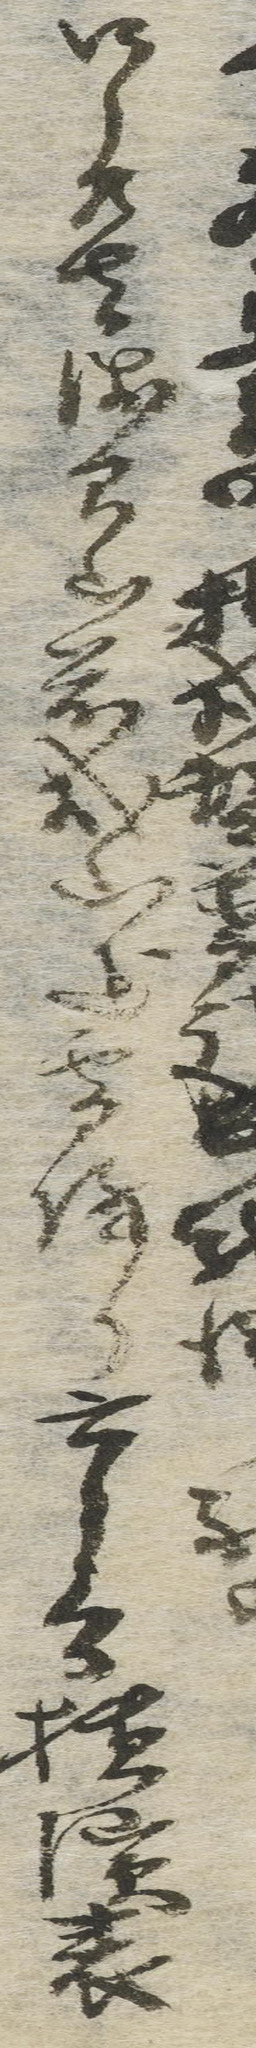四月廿七日浅間山前掛山迄雪降り六月三日横浜表
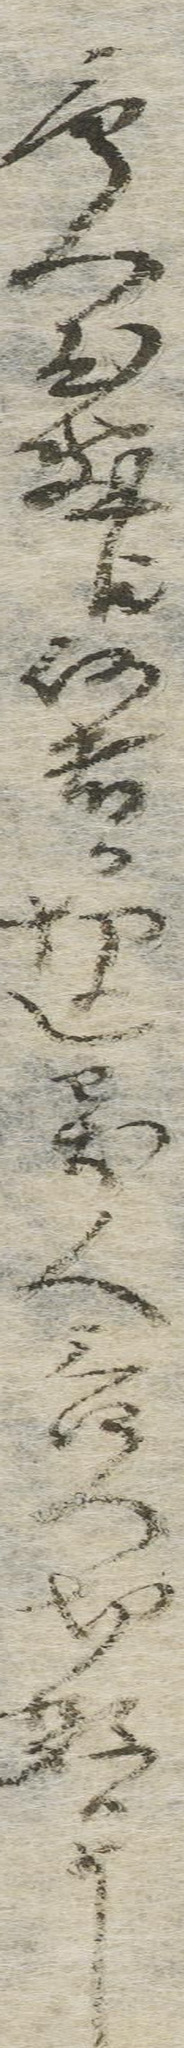唐人屋敷江何者か切込異人三四人切殺候よし
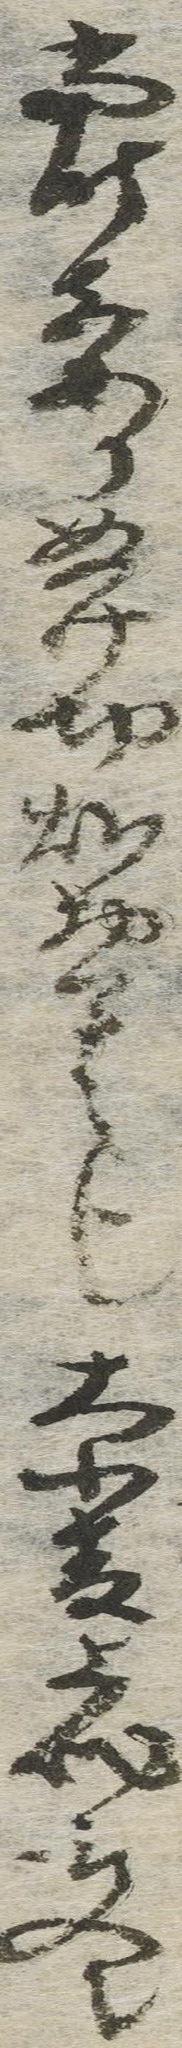当時しめりぬけ切畑物いたミ申候大小麦上作取入申候
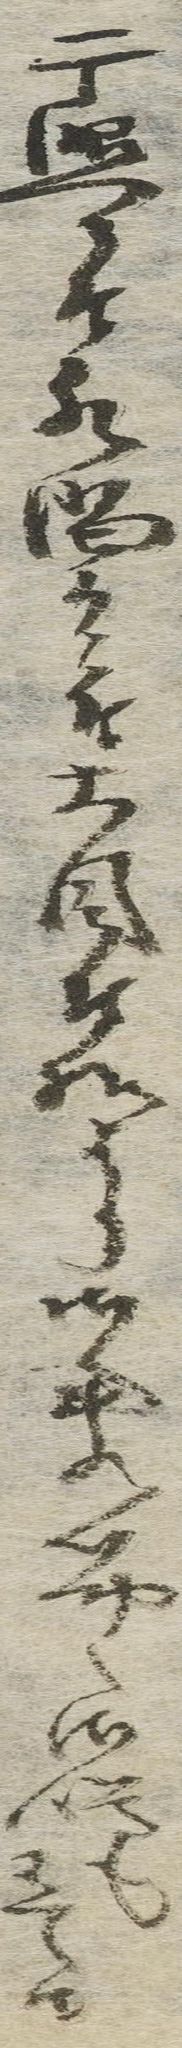干照二付水渇候二付大目付様より御用水筋之御噂も有之候
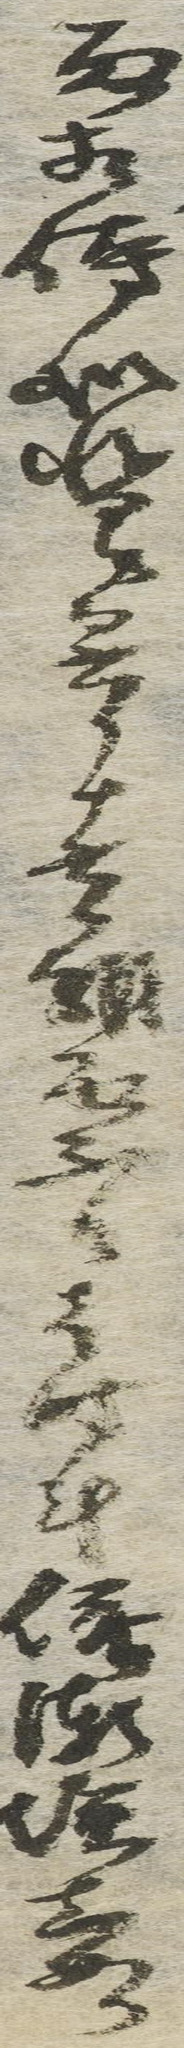雨相待候処暫二而六月十六日朝雨ふり其時計位漸堰しめり
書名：信濃越後　地震書留
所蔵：東京大学地震研究所図書室 Earthquake Research Institute Library, The University of Tokyo, JAPAN
